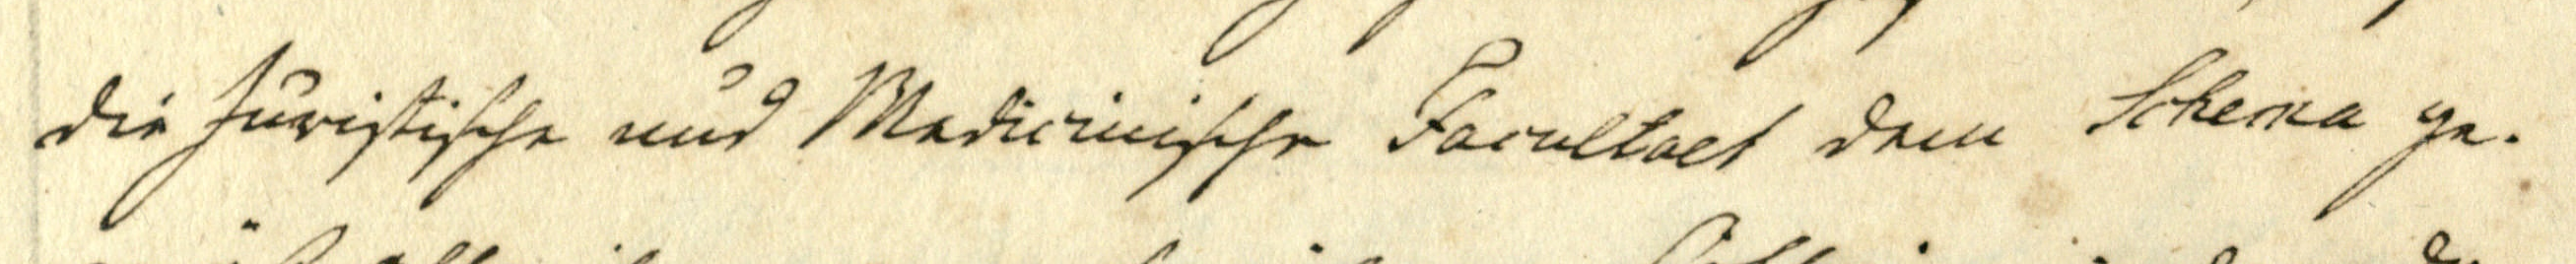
die Juristische und Medicinische Facultaet dem Schema ge¬
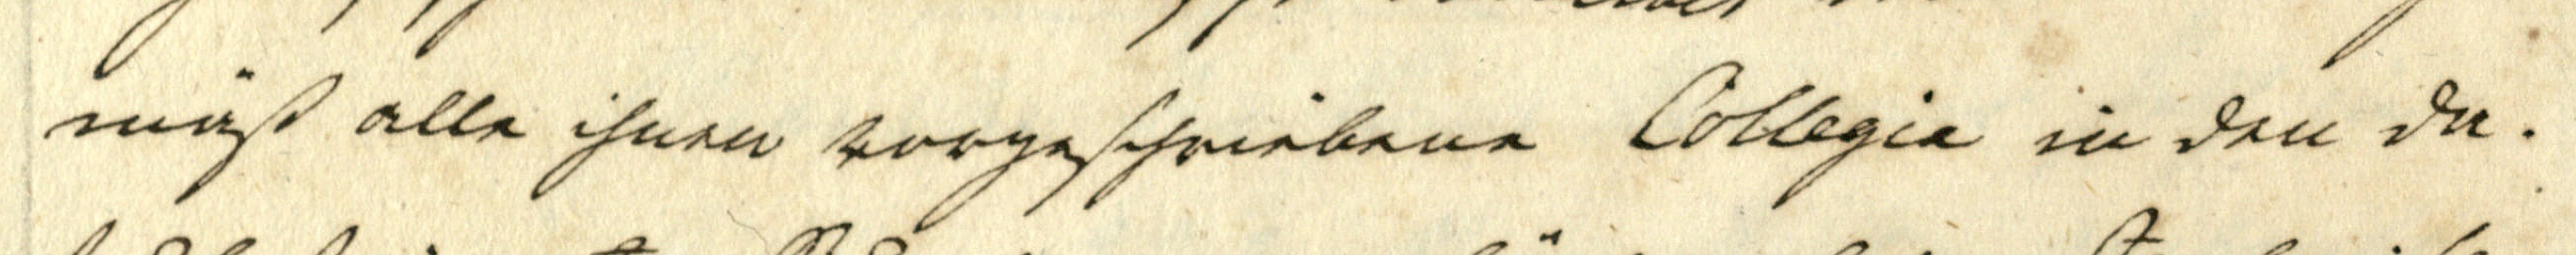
mäß alle ihnen vorgeschriebene Collegia in den da¬
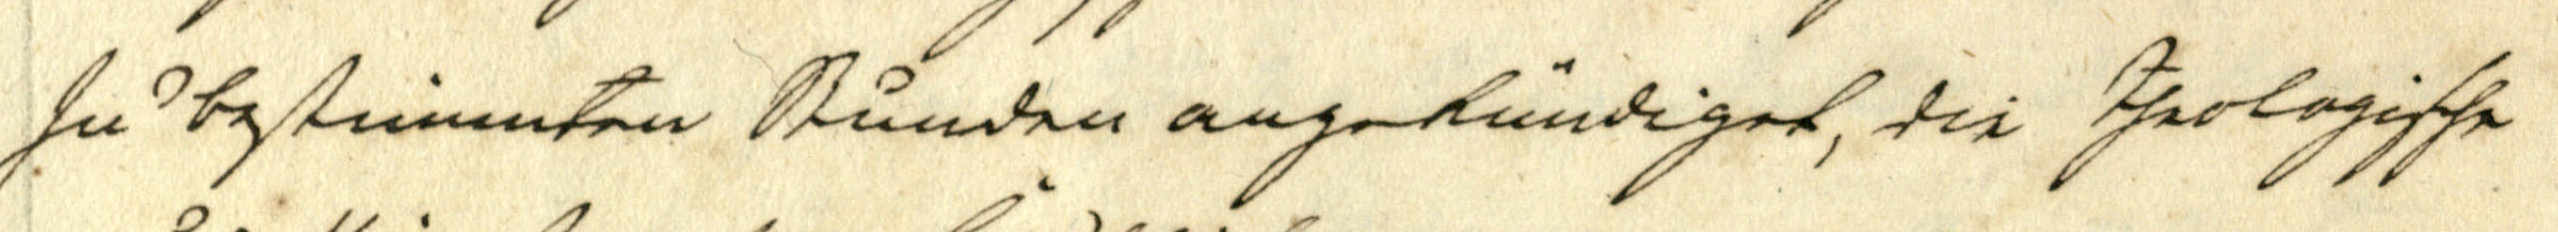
zu bestimmten Stunden angekündiget, die Theologische
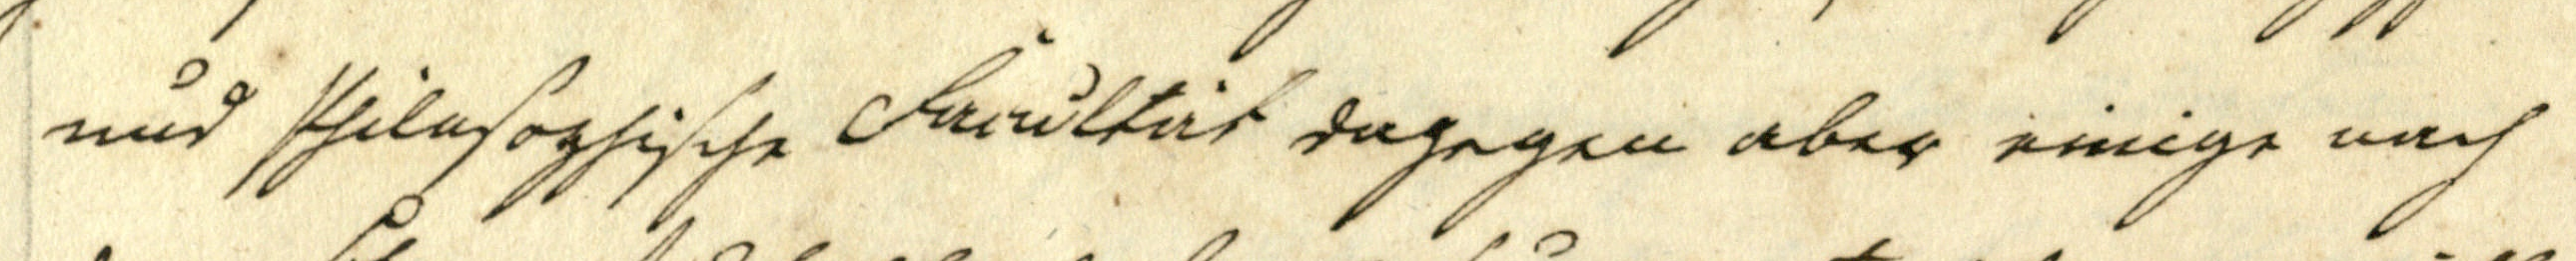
und Philosophische Facultät dagegen aber einige nach
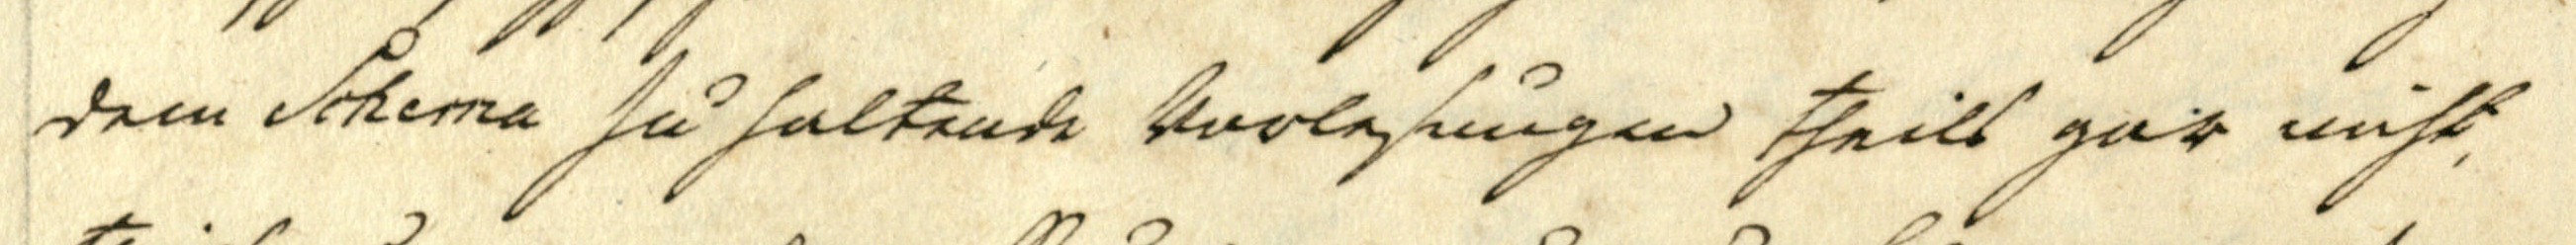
dem Schema zu haltende Vorlesungen theils gar nicht
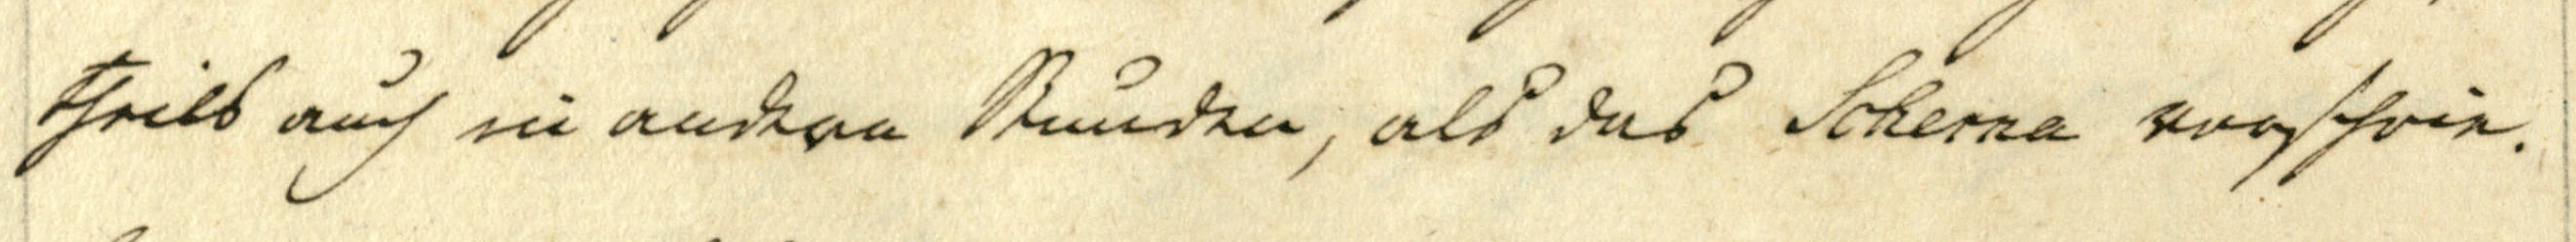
theils auch in andern Stunden, als das Schema vorschrie¬
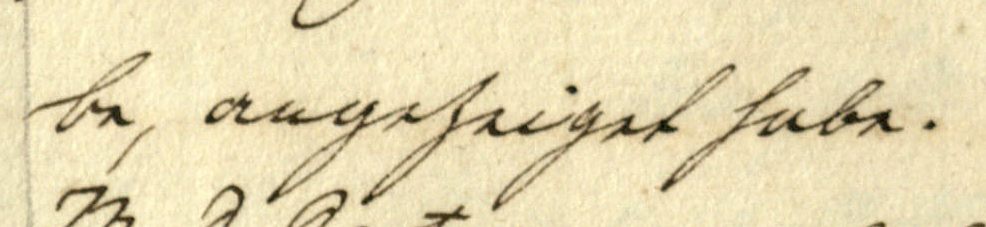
ben, angezeiget habe.
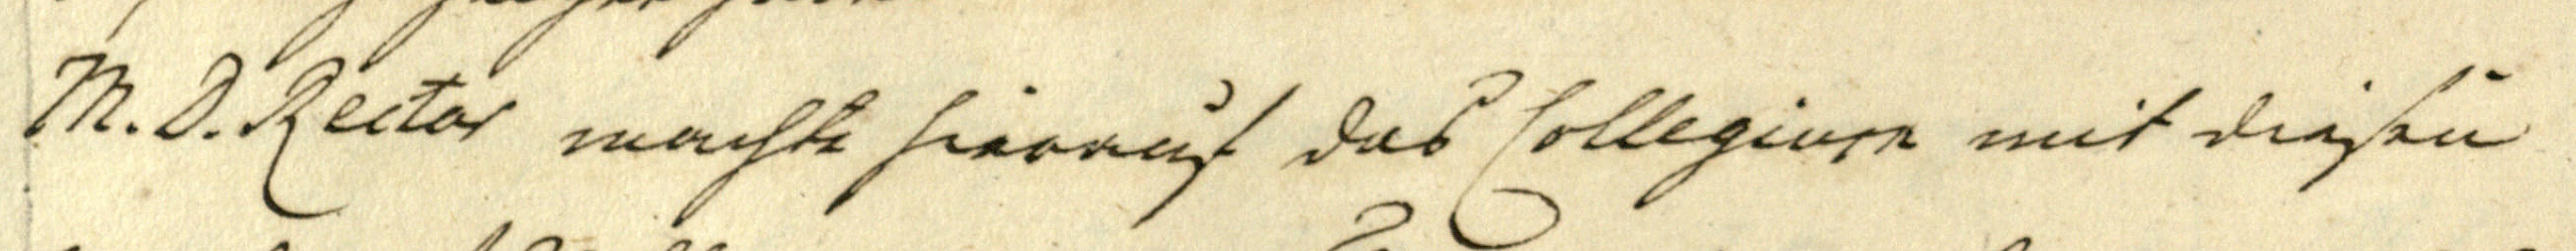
M. D. Rector machte hierauf das Collegium mit diesen
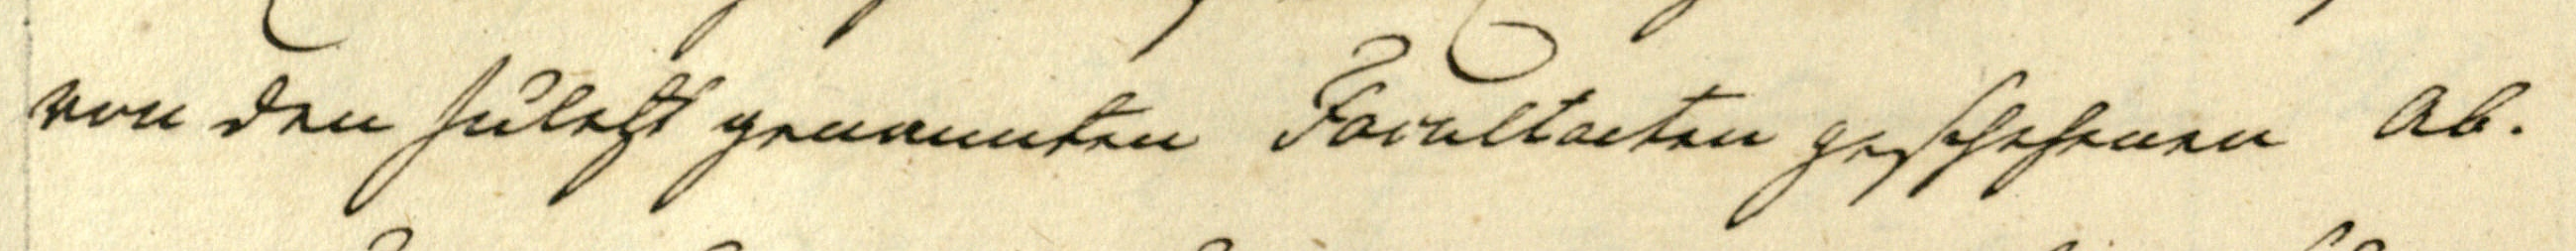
von den zuletzt genannten Facultaeten geschehenen Ab¬
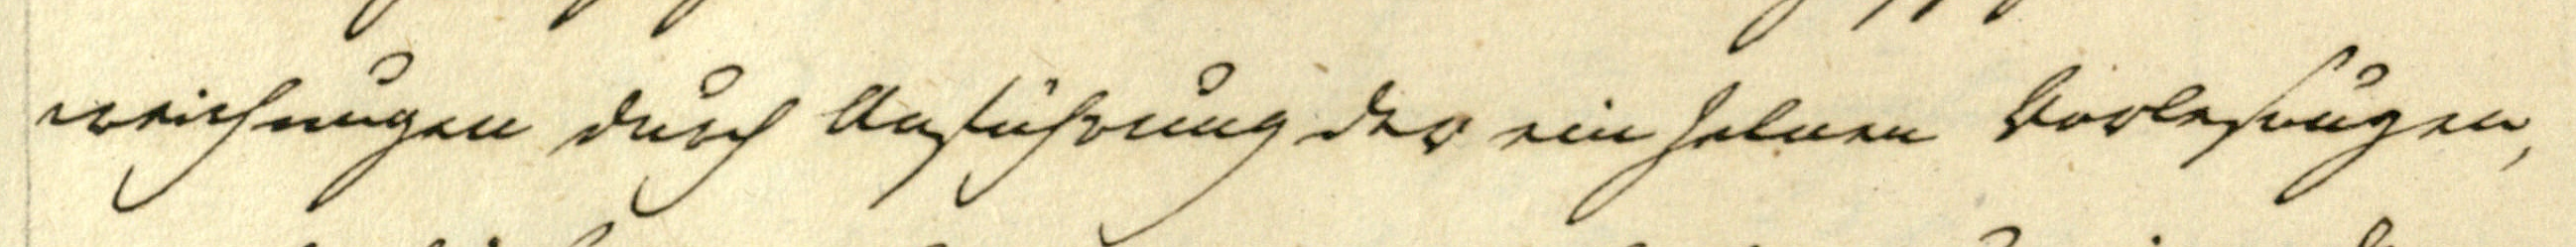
weichungen durch Anführung der einzelnen Vorlesungen,
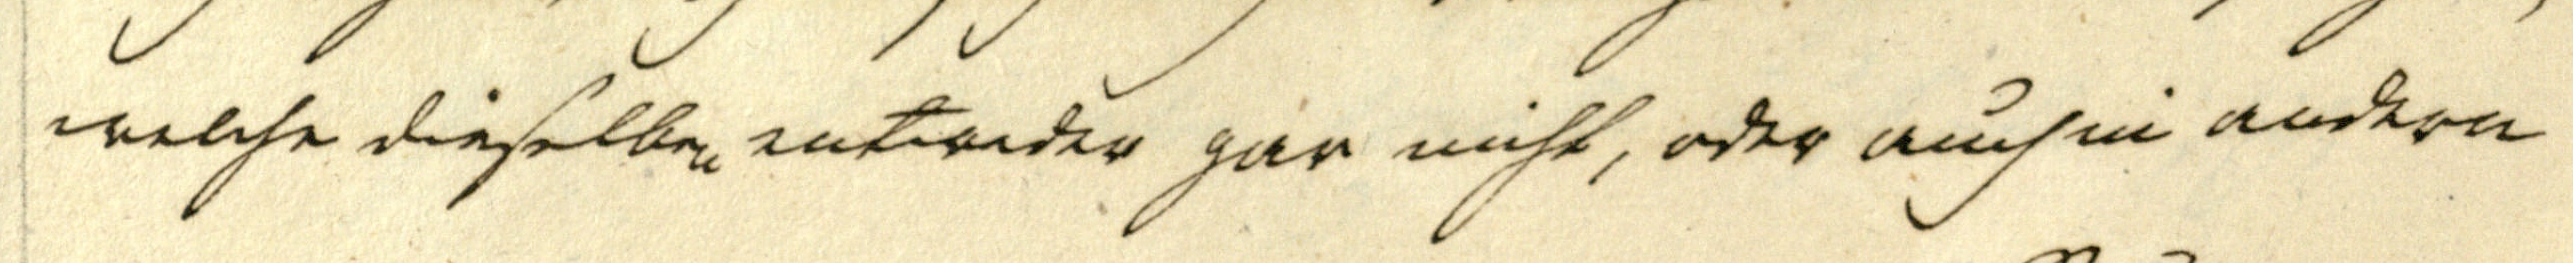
welche dieselben entweder gar nicht, oder auch in andern
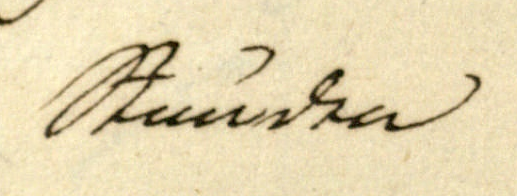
Stunden
